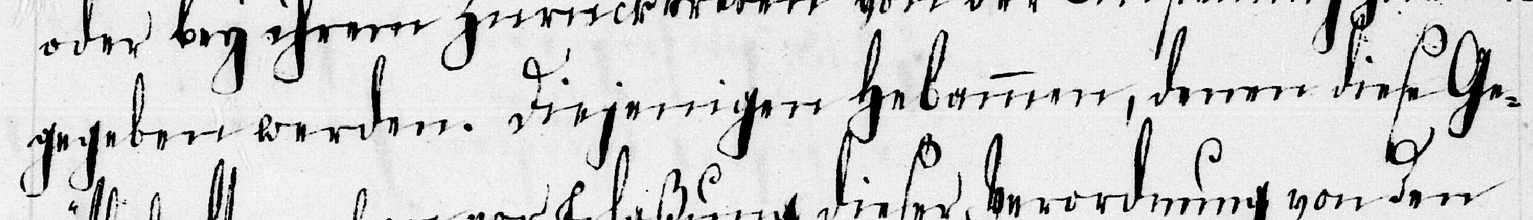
gegeben werden. Diejenigen Hebammen, denen diese Ge¬
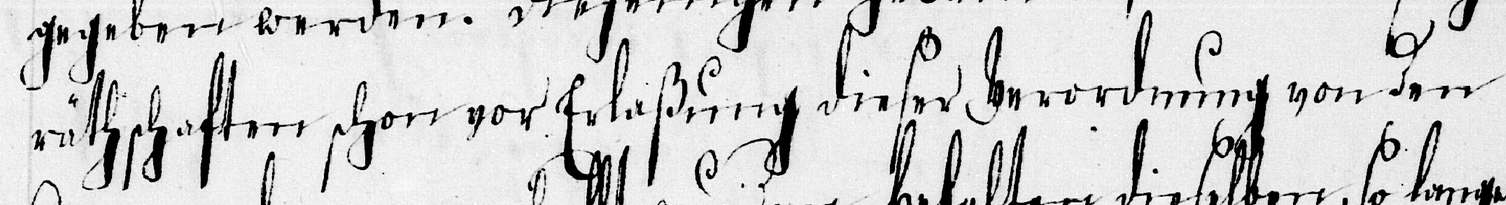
räthschaften schon vor Erlaßung dieser Verordnung von den
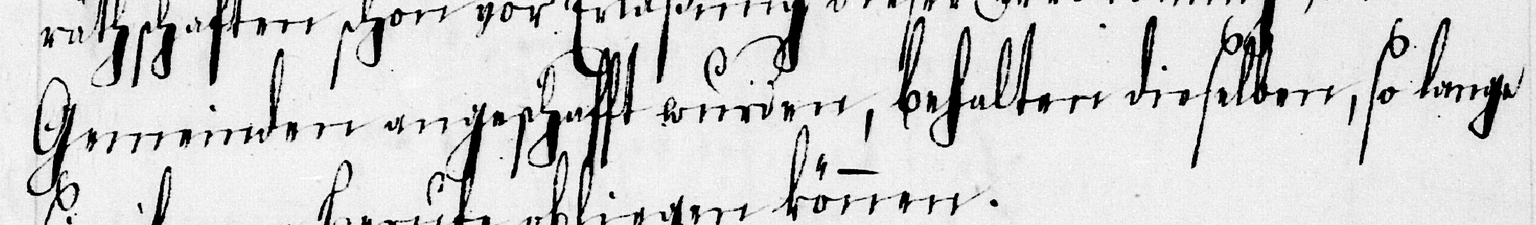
Gemeinden angeschafft wurden, behalten dieselben, so la¬
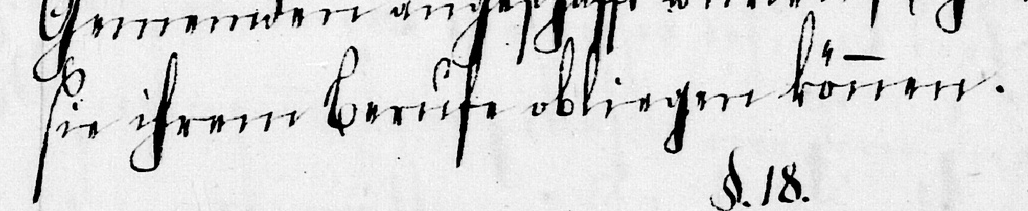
sie ihrem Berufe obliegen können.
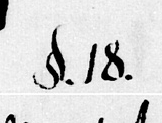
§. 18.
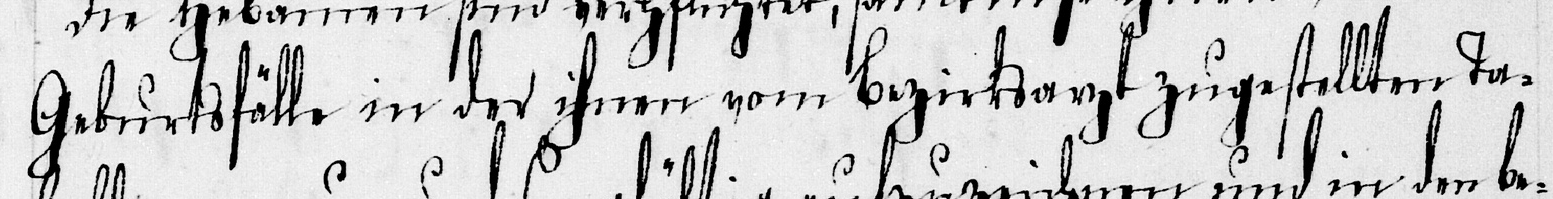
Geburtsfälle in der ihnen vom Bezirksarzt zugestellten Ta¬
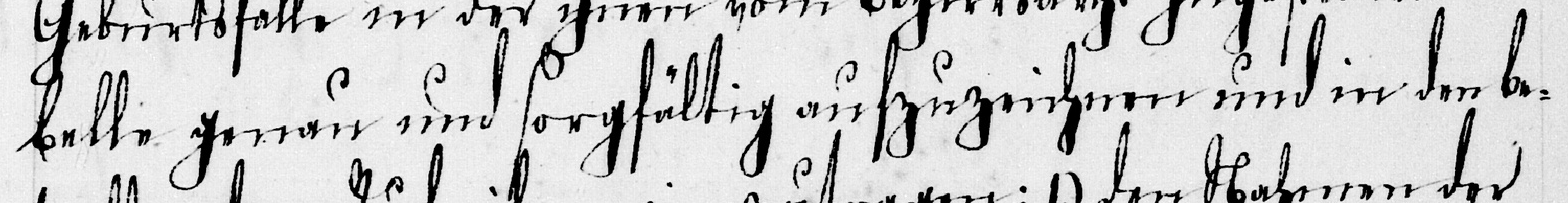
belle genau und sorgfältig aufzuzeichnen und in den be¬
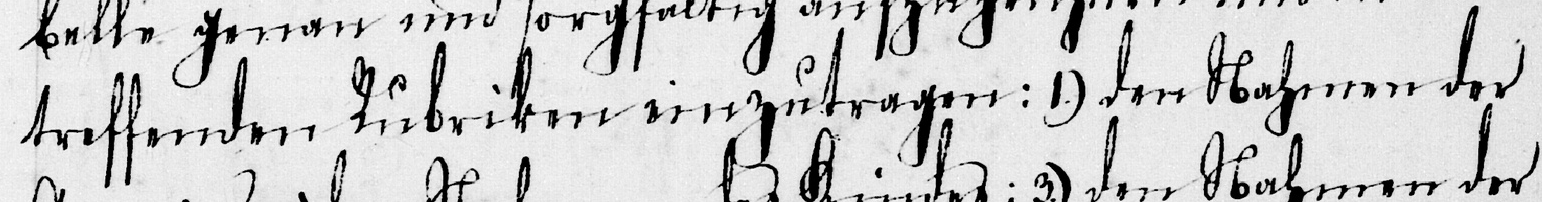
treffenden Rubriken einzutragen: 1.) den Nahmen der
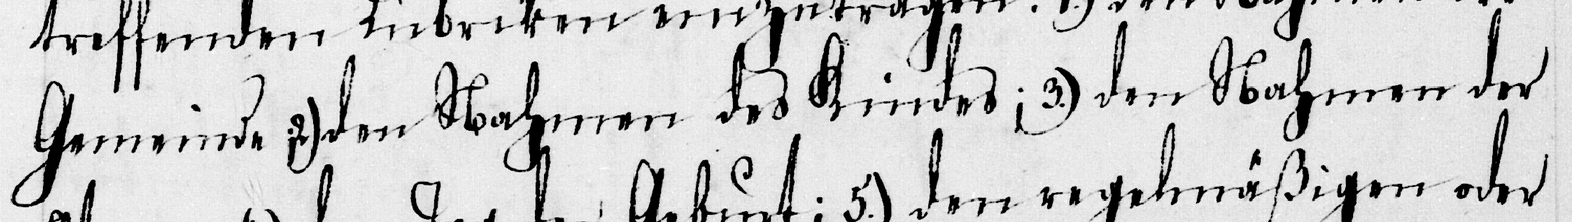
Gemeinde; 2.) den Nahmen des Kindes; 3.) den Nahmen der
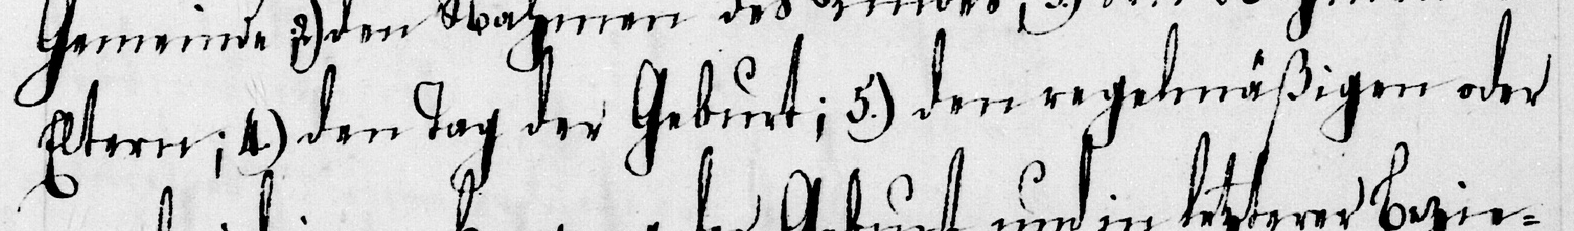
Eltern; 4.) den Tag der Geburt; 5.) den regelmäßigen oder
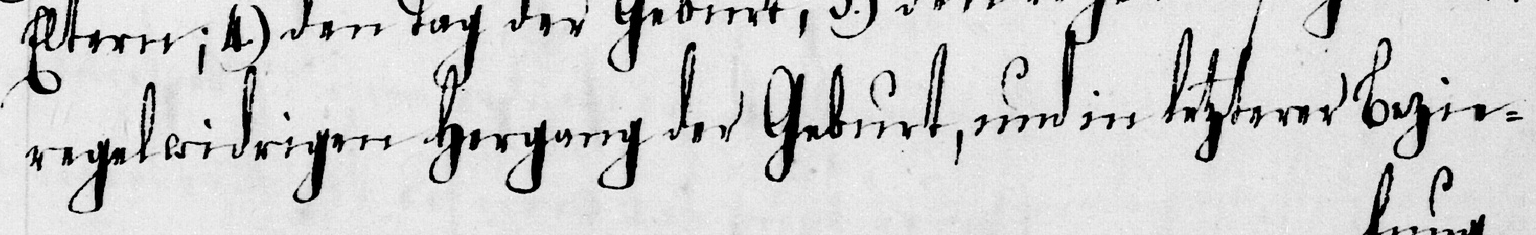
regelwidrigen Hergang der Geburt, und in letzterer Bezie-
